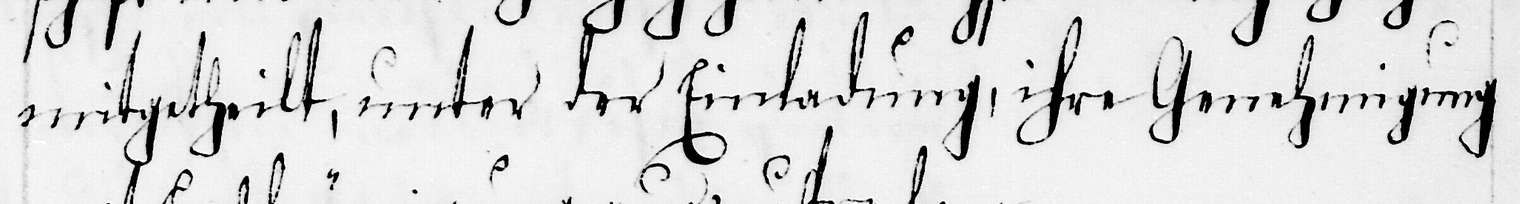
mitgetheilt, unter der Einladung, ihre Genehmigung
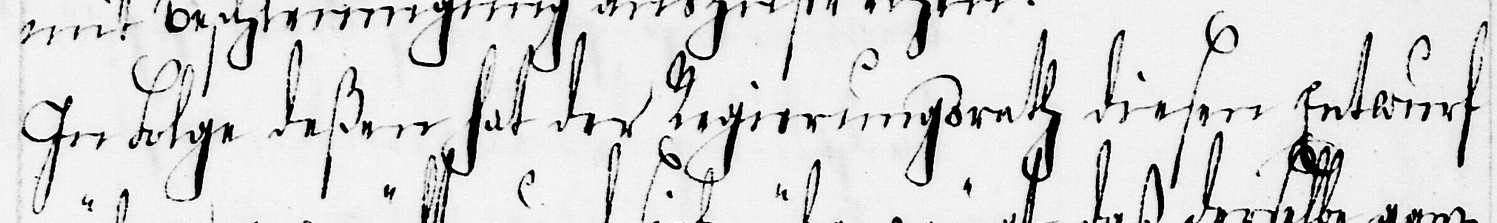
In Folge deßen hat der Regierungsrath diesen Entwurf
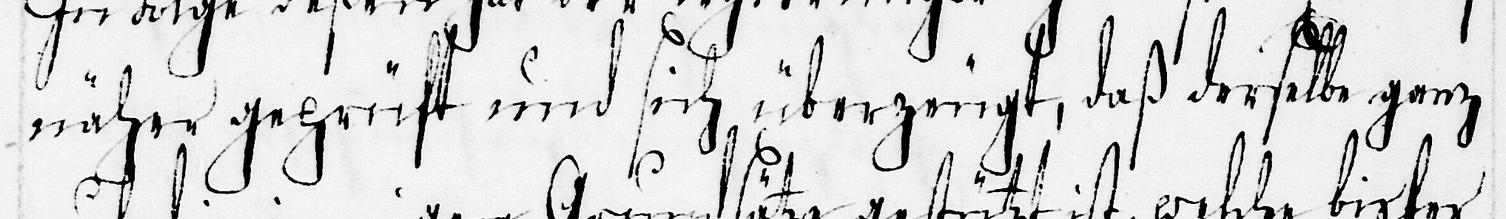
näher geprüft und sich überzeugt, daß derselbe ganz
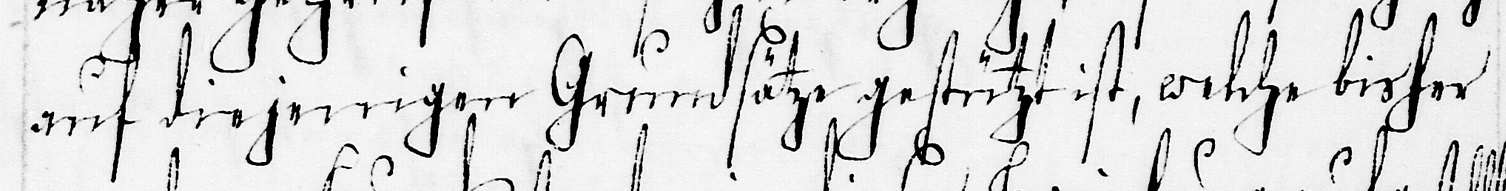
auf diejenigen Grundsätze gestützt ist, welche bisher
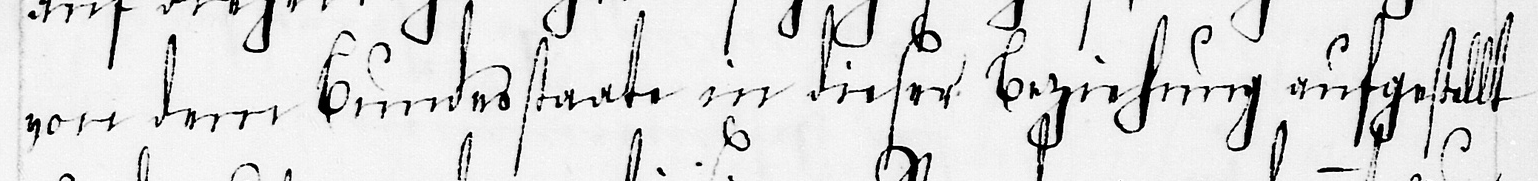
von dem Bundesstaate in dieser Beziehung aufgestellt
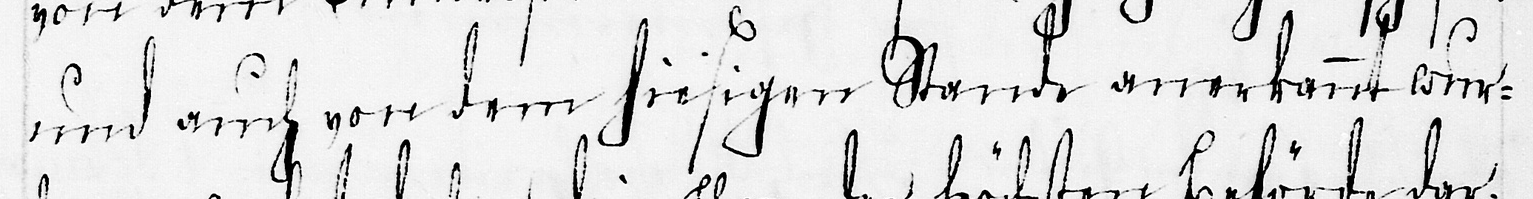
und auch von dem hiesigen Stande anerkannt wur¬
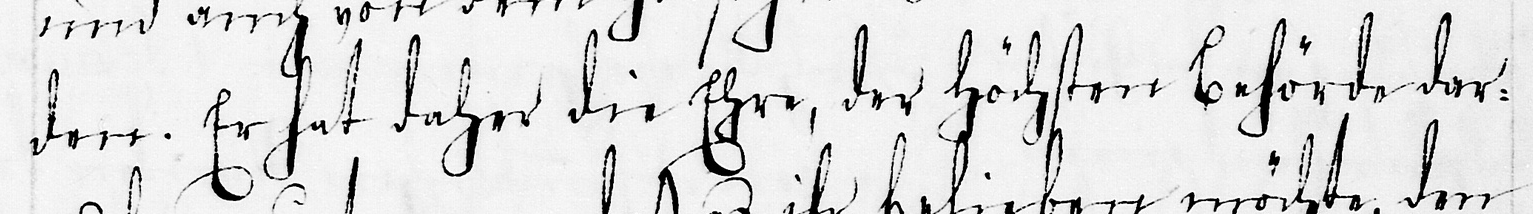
den. Er hat daher die Ehre, der Höchsten Behörde dar¬
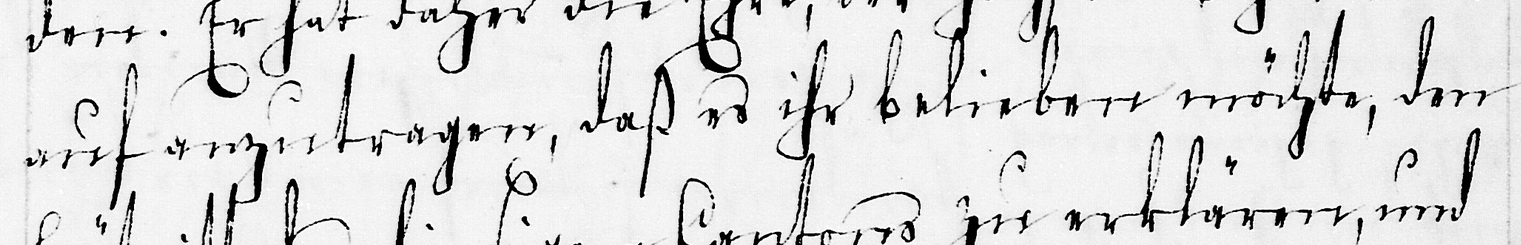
auf anzutragen, daß es ihr belieben möchte, den
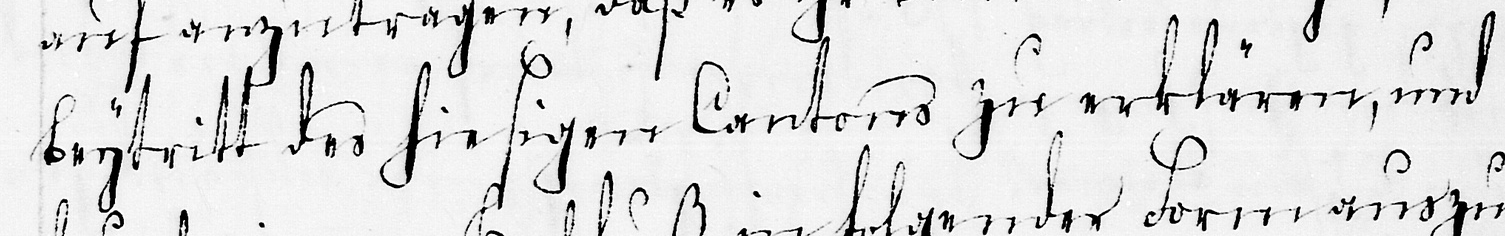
Beytritt des hiesigen Cantons zu erklären, und
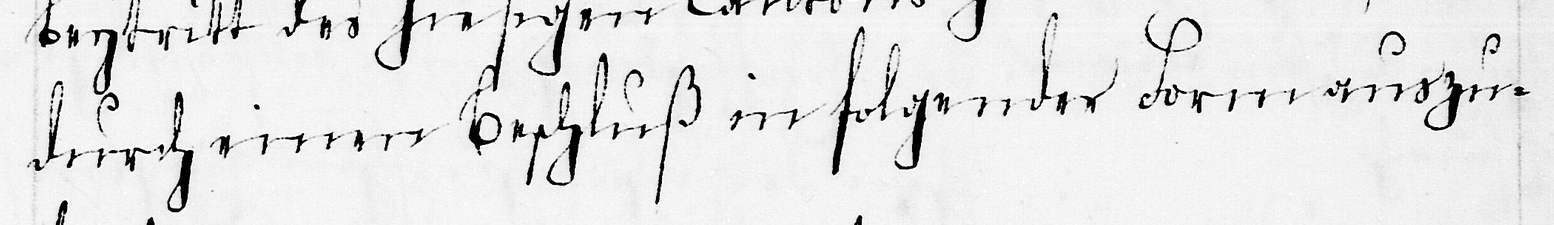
durch einen Beschluß in folgender Form auszu¬
